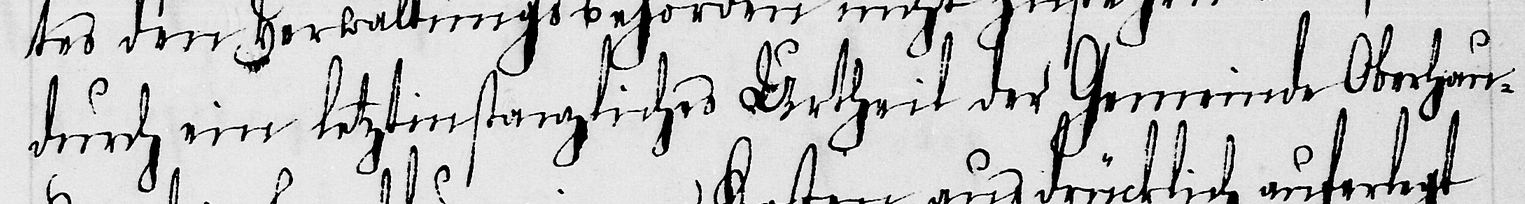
durch ein letztinstanzliches Urtheil der Gemeinde Oberhau¬
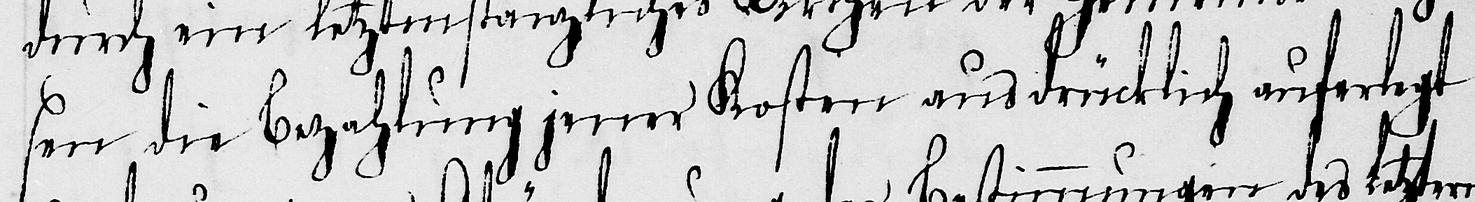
sen die Bezahlung jener Kosten ausdrücklich auferlegt
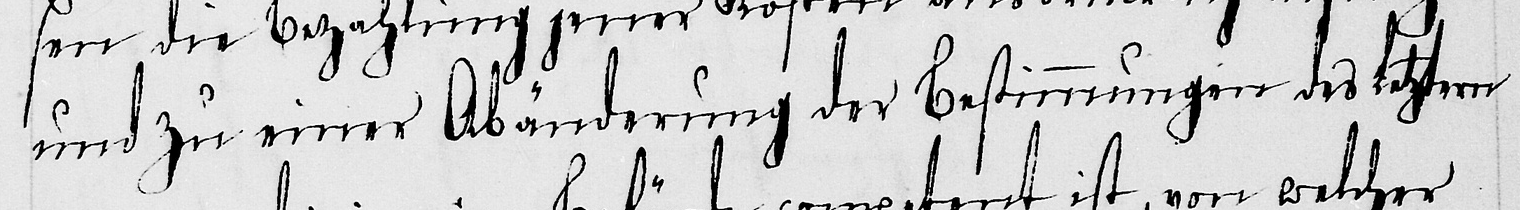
und zu einer Abänderung der Bestimmungen des Letztern
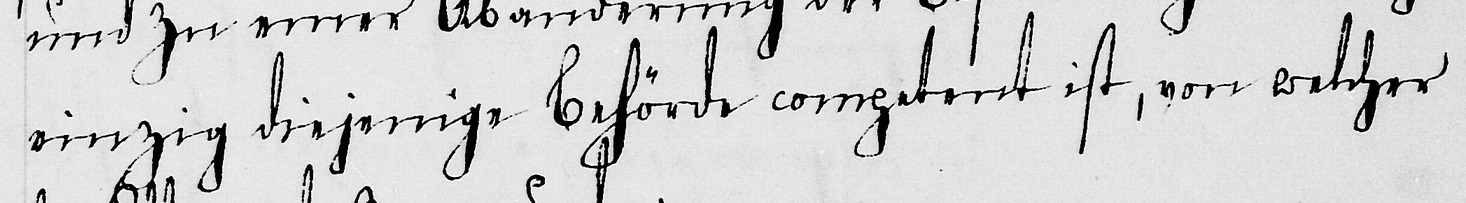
einzig diejenige Behörde competent ist, von welcher
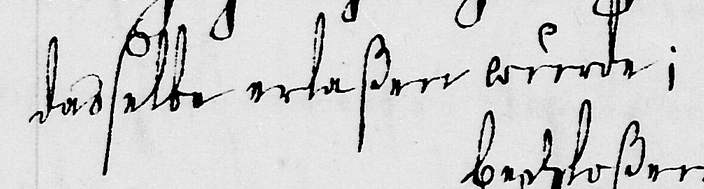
dasselbe erlaßen wurde;
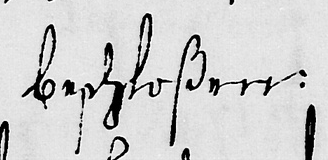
beschloßen:
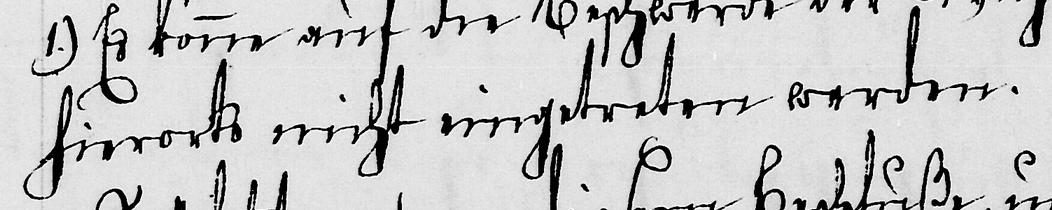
hierorts nicht eingetreten werden.
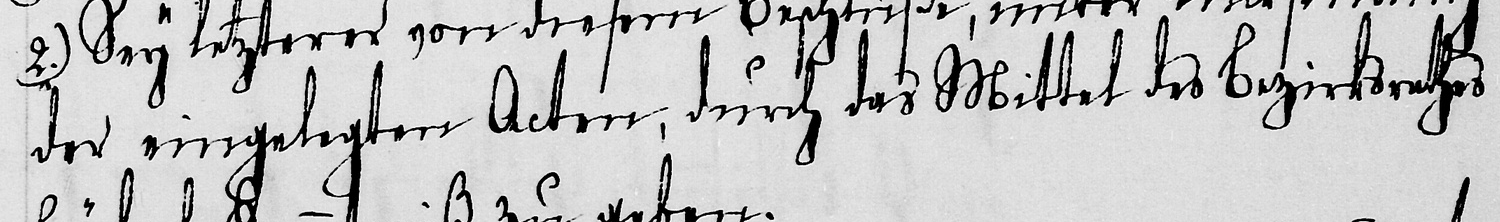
der eingelegten Acten, durch das Mittel des Bezirksrathes
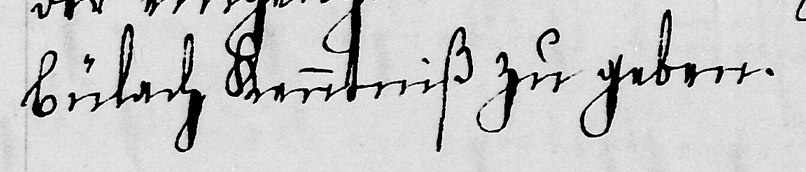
Bülach Kenntniß zu geben.
